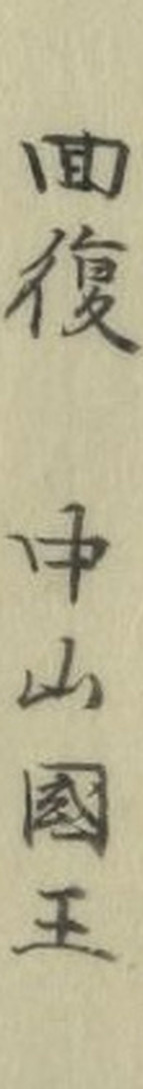回復中山国王
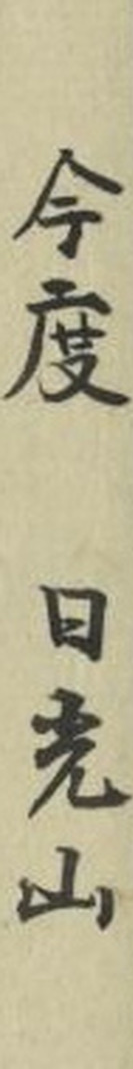今度日光山
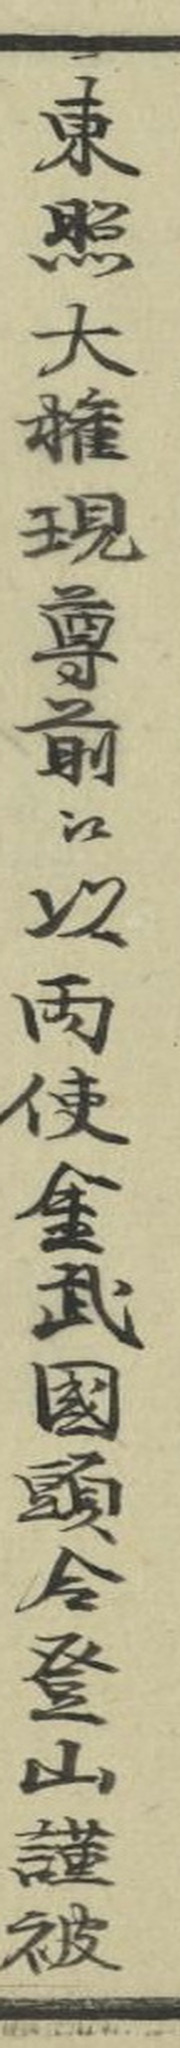東照大権現尊前え以両使金武国頭令登山謹被
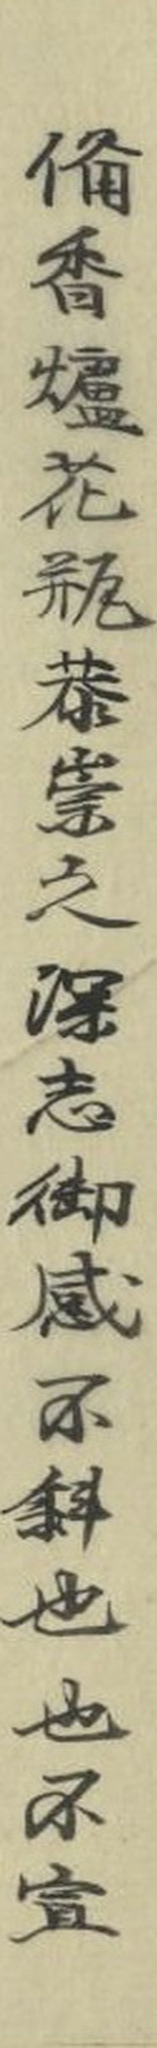偏香炉花瓶恭崇之深志御感不斜也也不宣
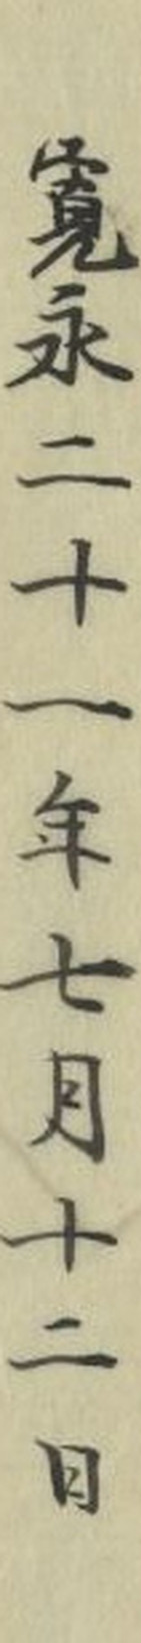寛永二十一年七月十二日
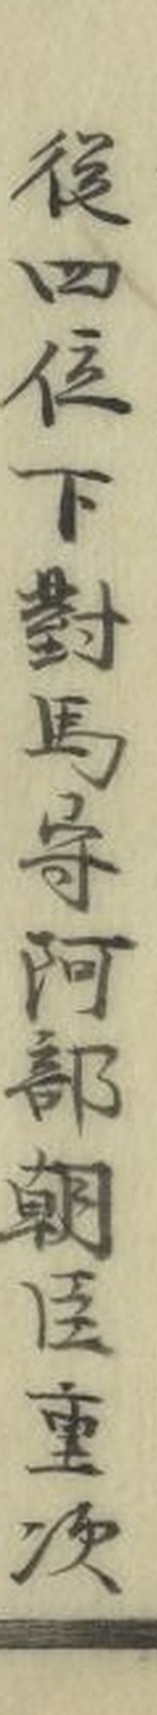従四位下對馬守阿部朝臣重次
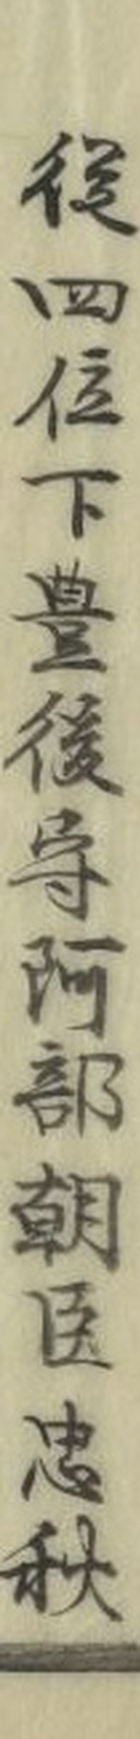従四位下豊後守阿部朝臣忠秋
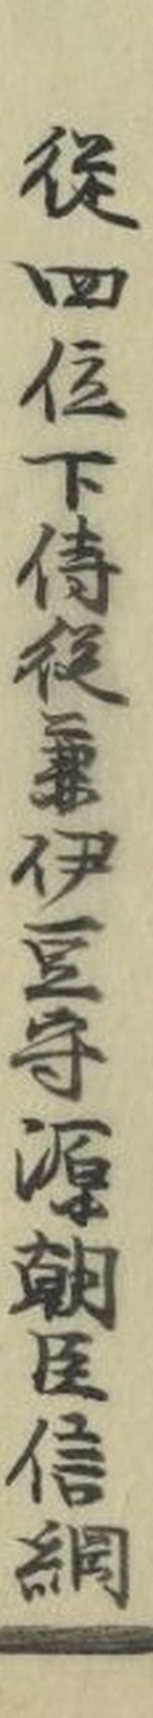従四位下侍従兼伊豆守源朝臣信綱
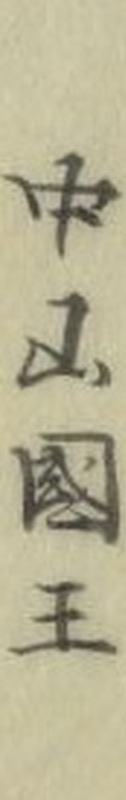中山国王

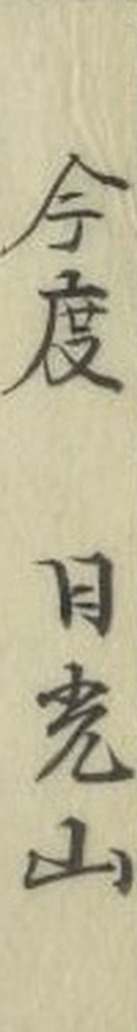今度日光山
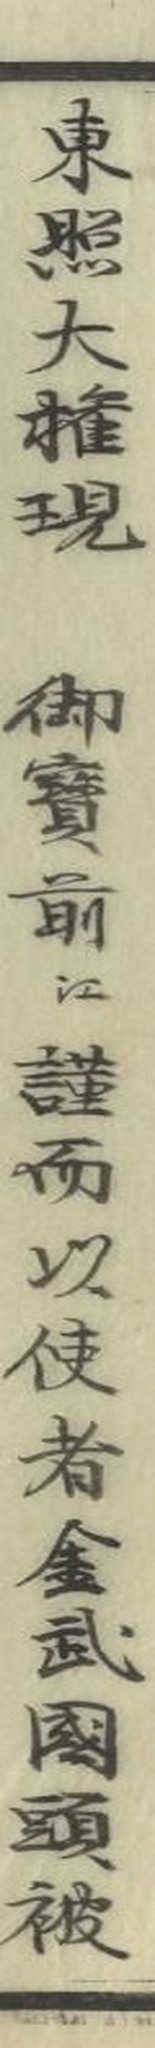東照大権現御宝前え謹而以使者金武国頭被
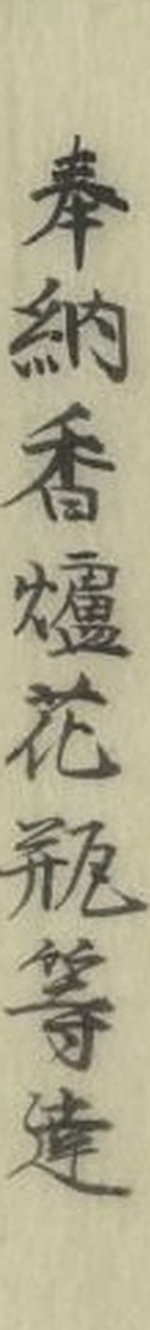奉納香炉花瓶等達
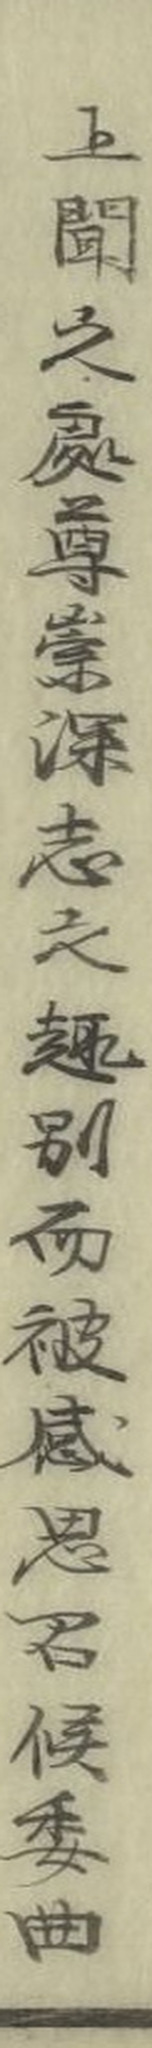上聞之處尊崇深志之趣別而被感思召候委曲
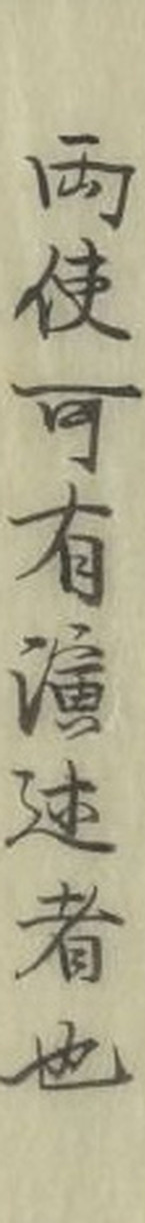両使可有演延者也
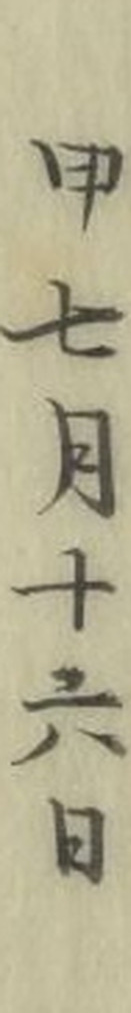申七月十六日
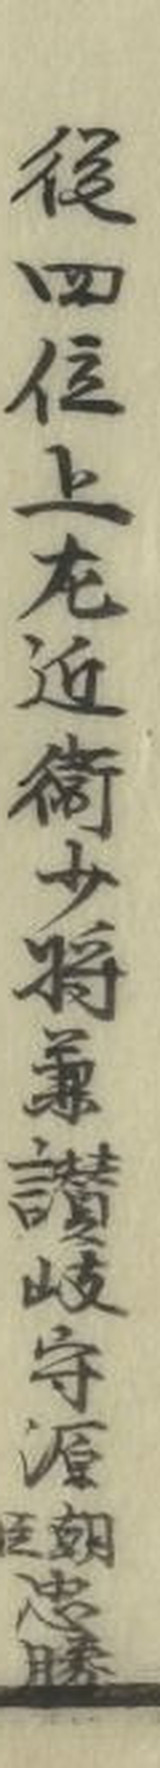従四位上左近衛少将兼讃岐守源源臣忠勝
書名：琉球往来（上）
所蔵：University of the Ryukyus Library
